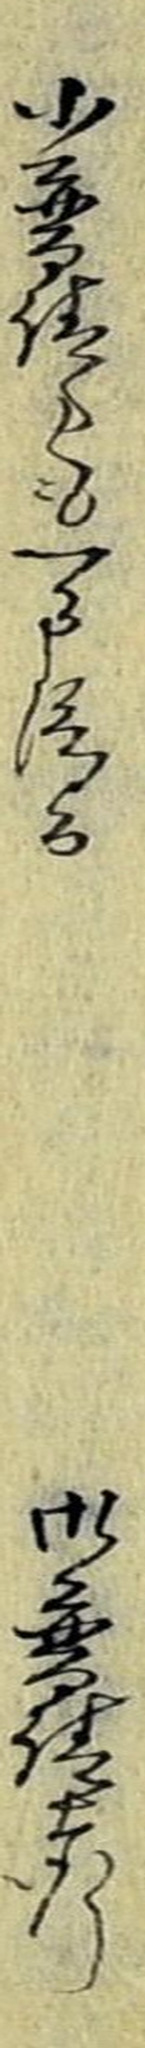小普請方へも可申渡旨御普請奉行
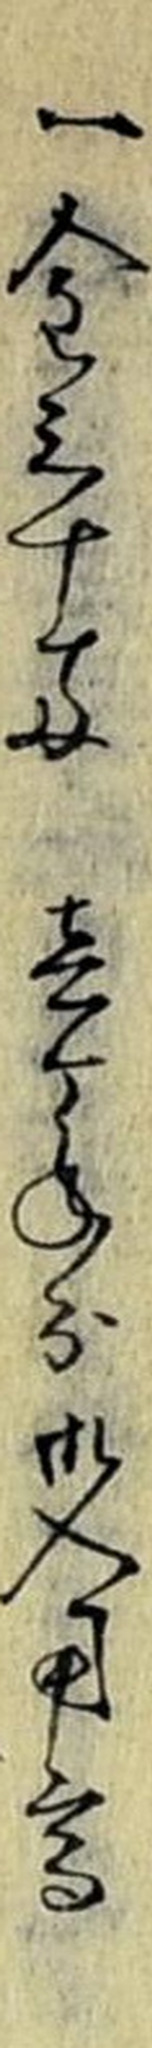一金三十両壱ヶ年分御入用高
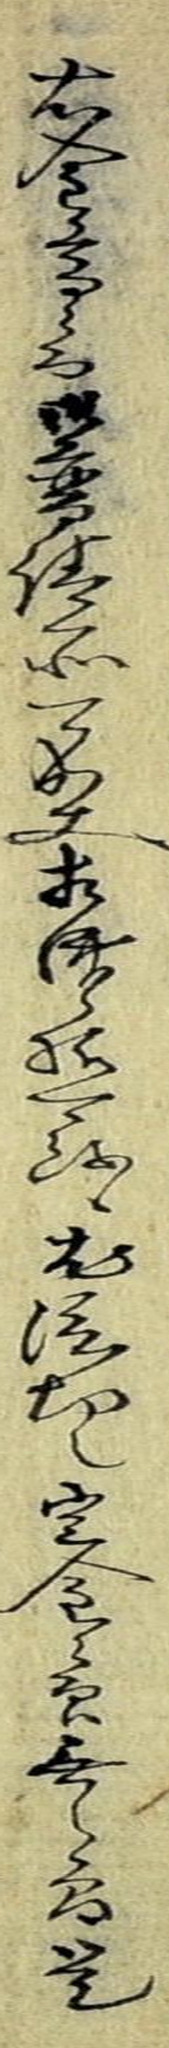右金高に而御普請所可成丈相済候様可致候尤渡切レ定金に而は無之候間是
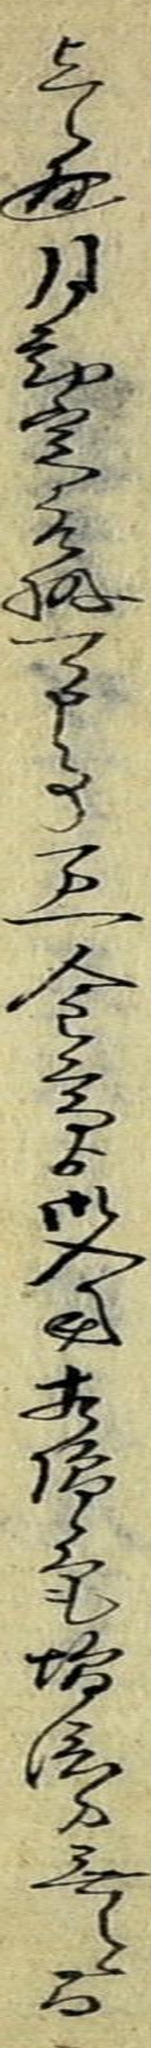迄之通月勘定取扱可申事万一金高ゟ御入用相増候而も増渡方無之候間
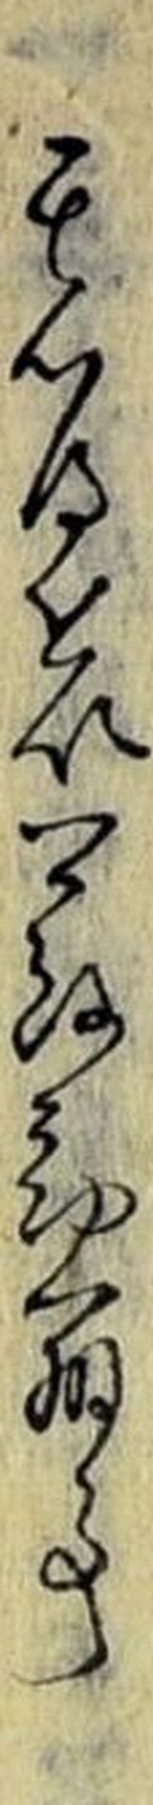其心得を以可致勘弁事
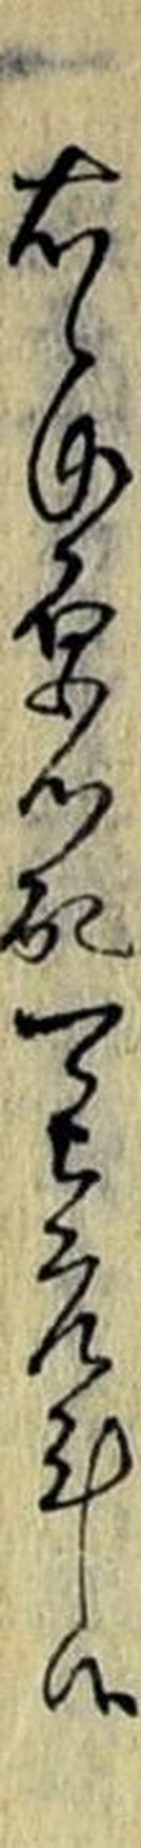右之趣厚心配可被取斗候
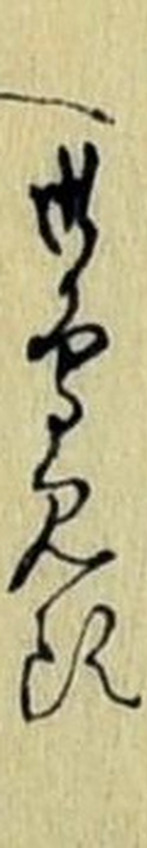御鳥見頭
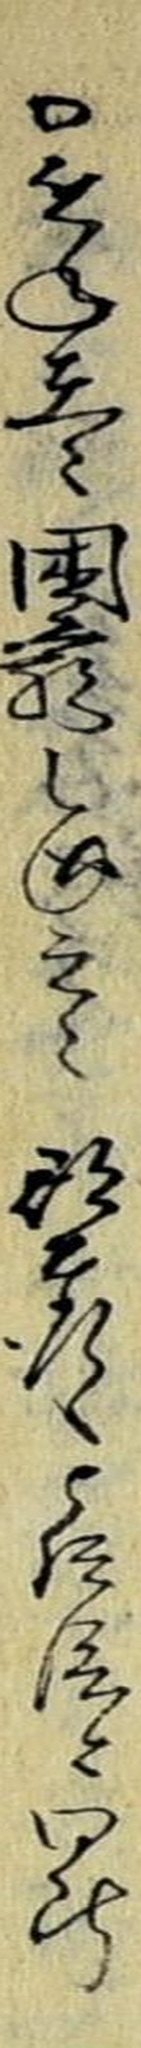○近年在々困窮之趣云々郡奉行へ被仰渡と同断
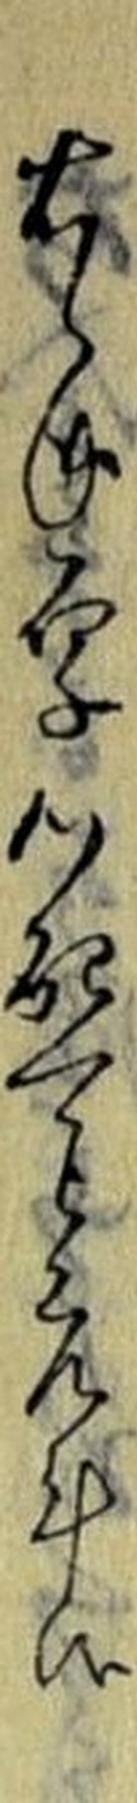右之趣厚心配可被取斗候
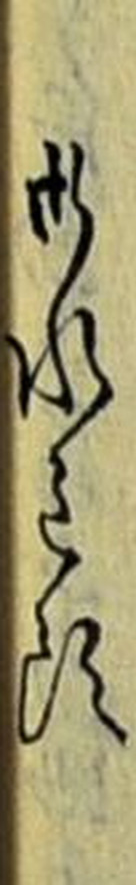御水主頭
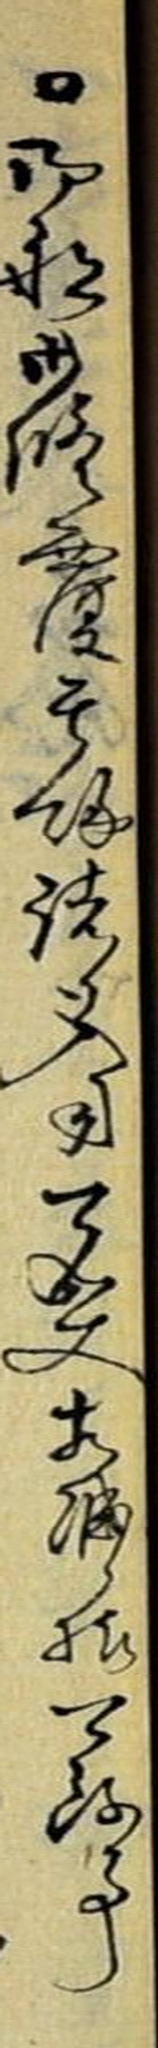○御船御修覆其餘諸御入用可成丈相減候様可致事
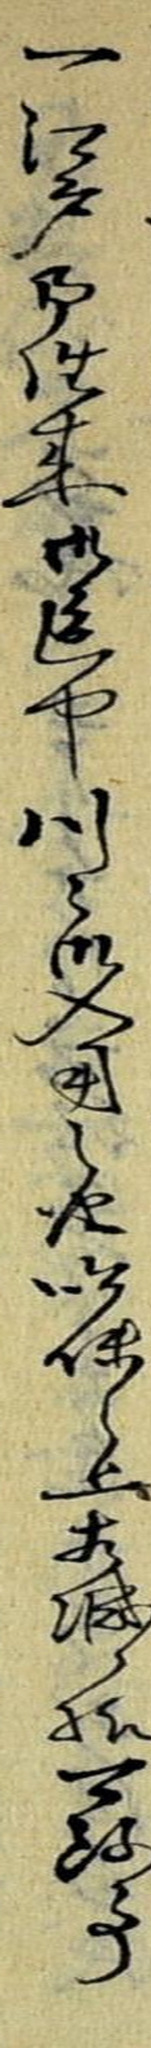一江戸御往来御道中川々御入用之儀吟味之上相減候様可致事
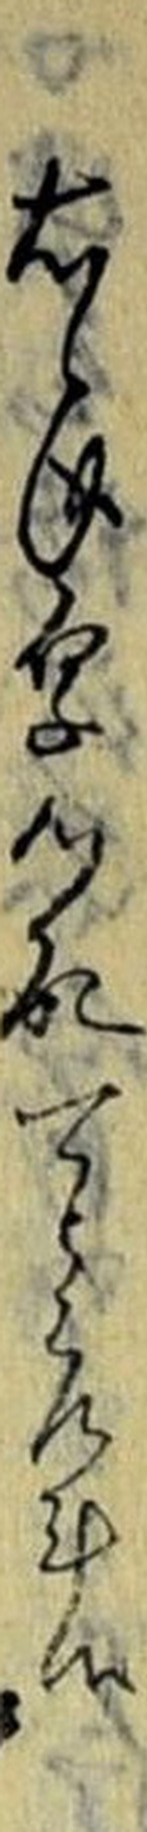右之趣厚心配可被取斗候
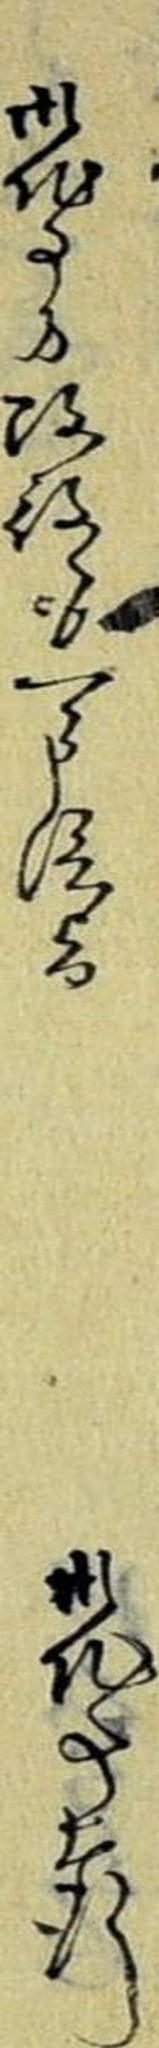御作事方改役へも可申渡旨御作事奉行
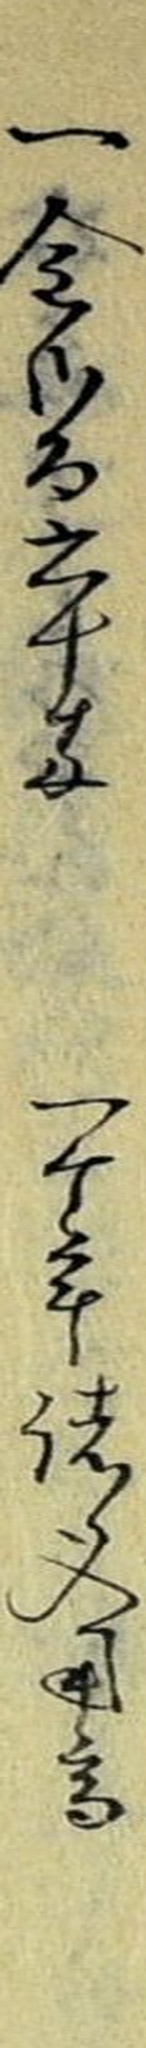一金弐百六十両一ヶ年諸御入用高
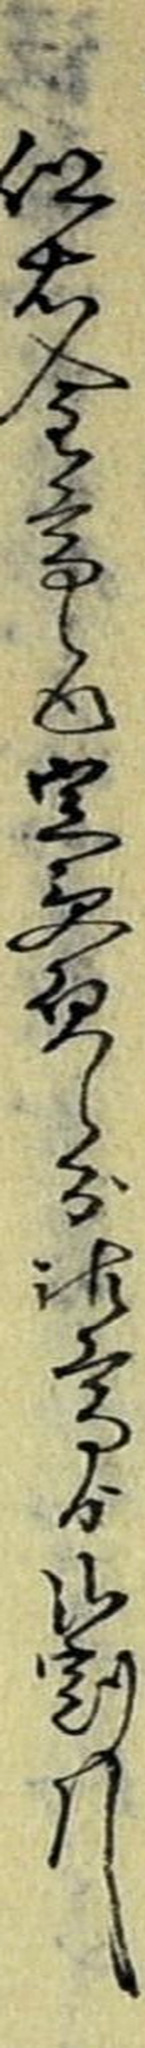但右金高之内定受負之分銀高ゟ弐割引
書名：命令之部 四
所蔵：福井県文書館 Fukui Prefectural Archives
